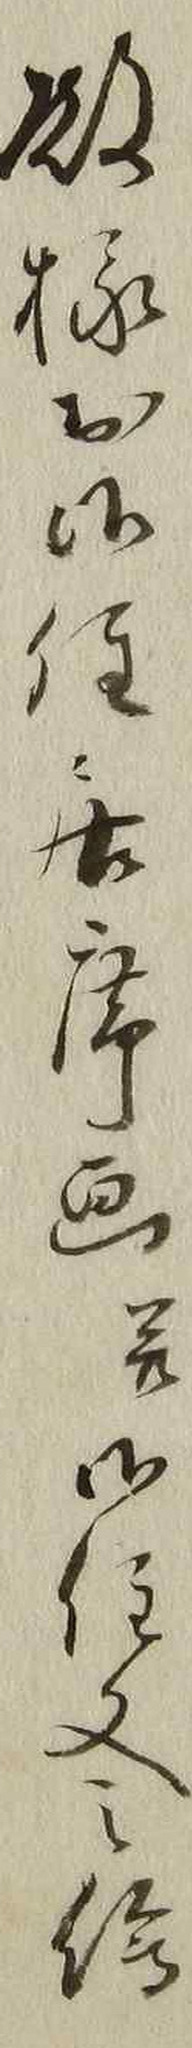殿様於御住居席画并御注文之絵
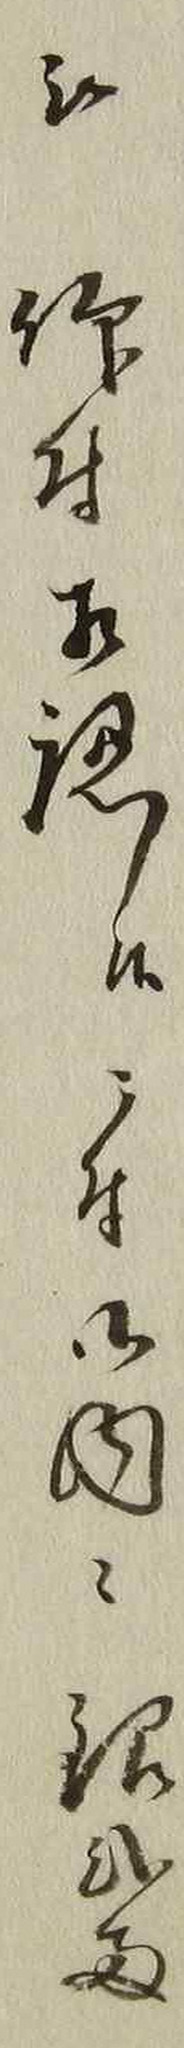被仰付相認候ニ付御内々銀弐両
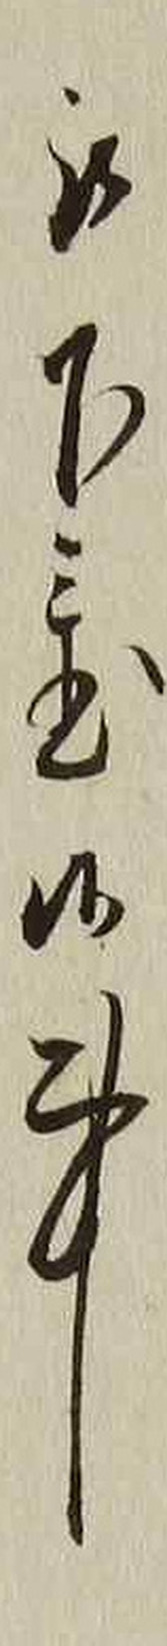被下置候事
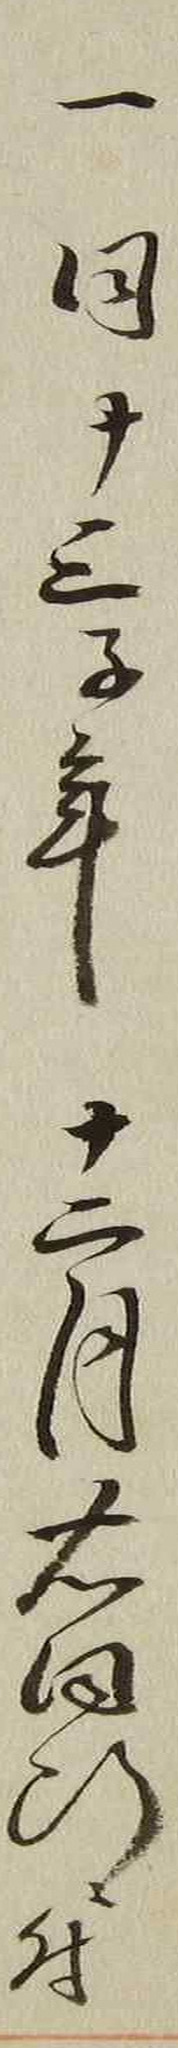一同十三子年十二月右同断ニ付
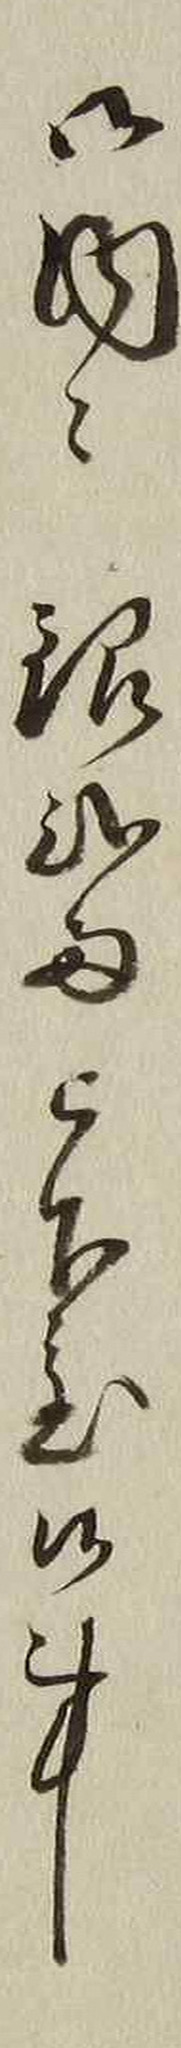御内々銀弐両被下置候事
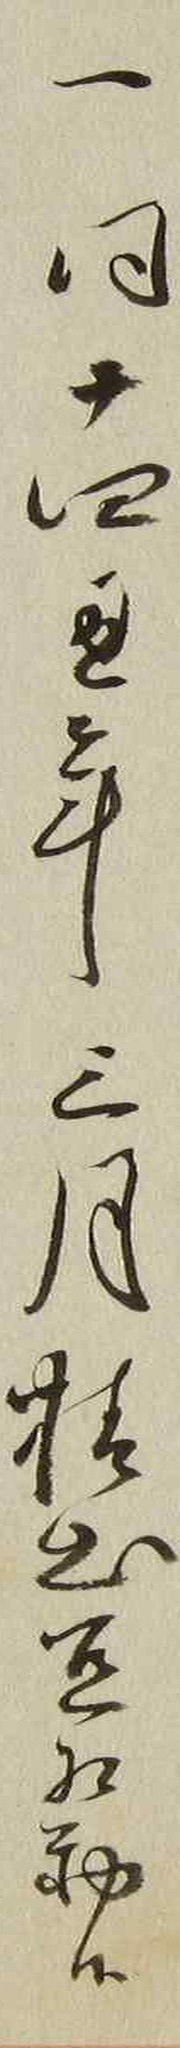一同十四丑年三月精出宜相勤候
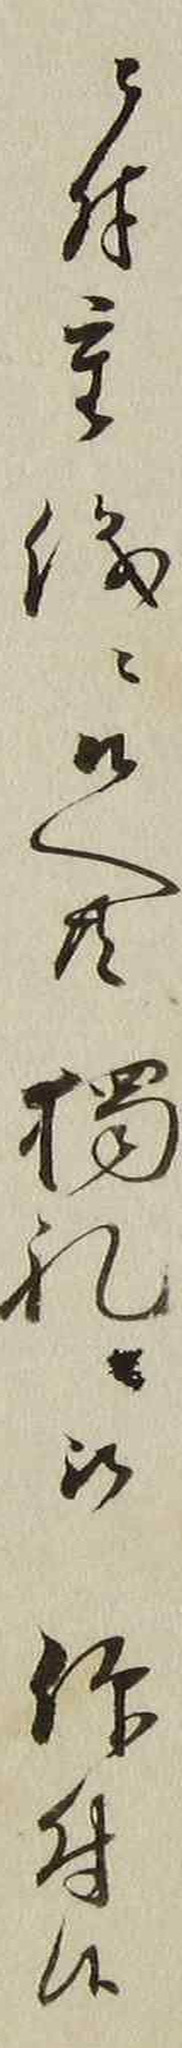ニ付重儀ニ候へ共独礼ニ被仰付候

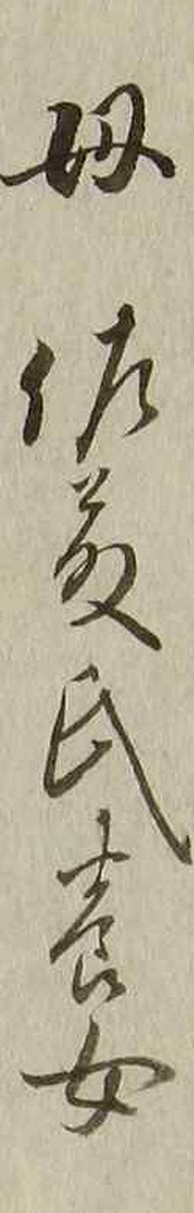母佐藤氏養女
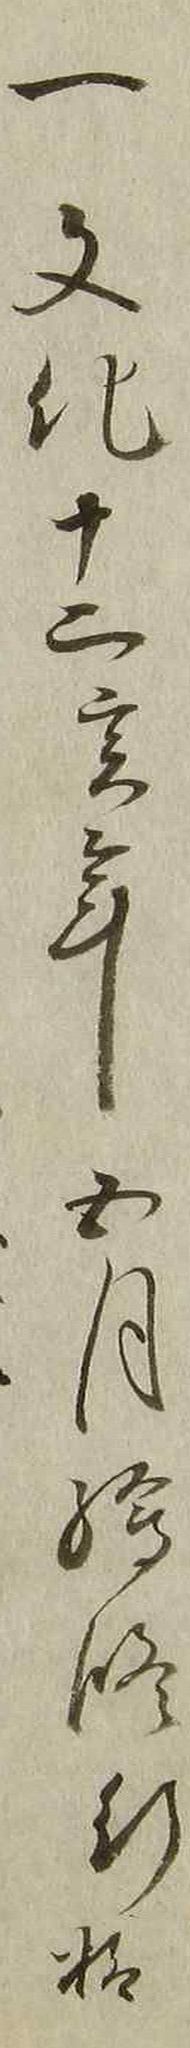一文化十二亥年五月絵修行精
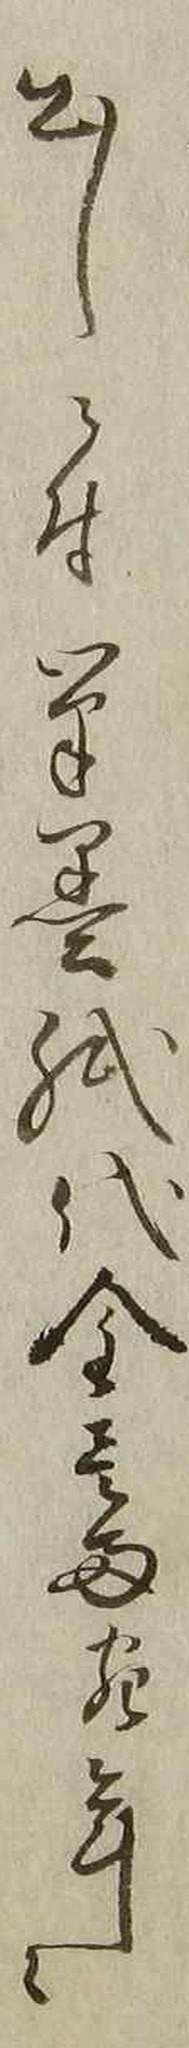出し候ニ付筆墨紙代金壱両宛年々
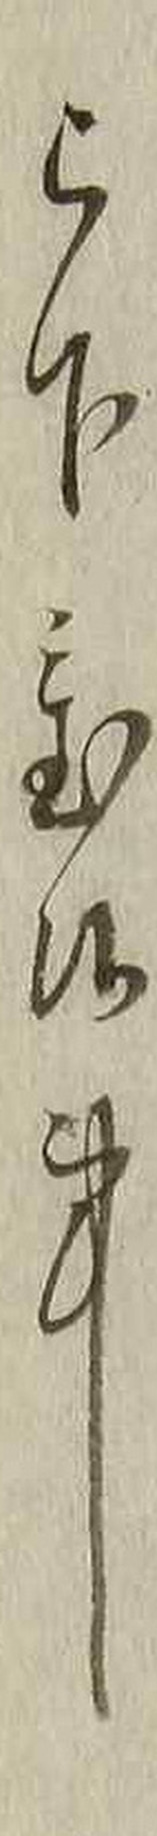被下置候事
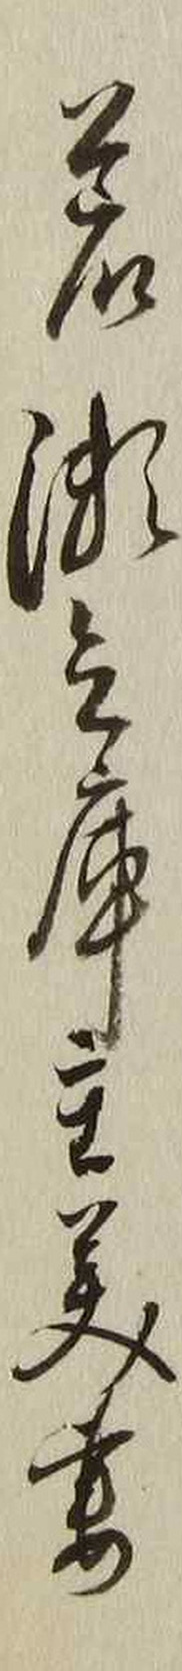女若瀬兵庫重美妻
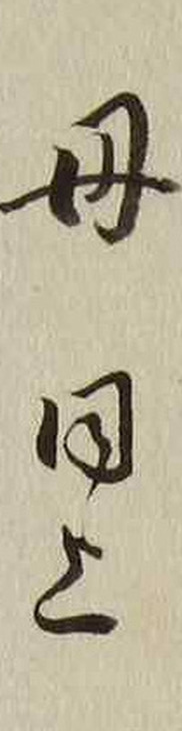母同上
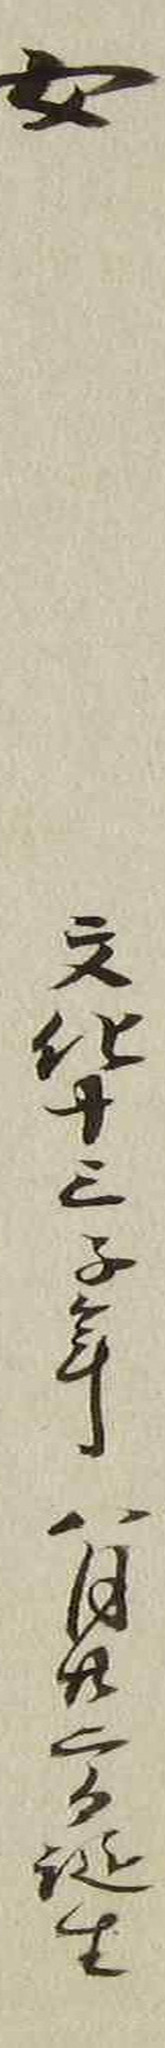女文化十三子年八月廿二日誕生
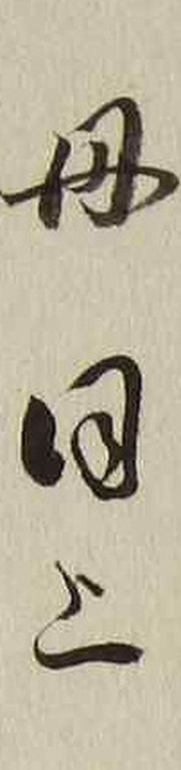丹同上

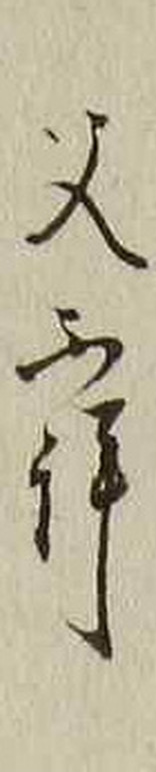父不詳
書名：諸士系譜　巻之132　た之部8
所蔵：会津若松市立会津図書館
